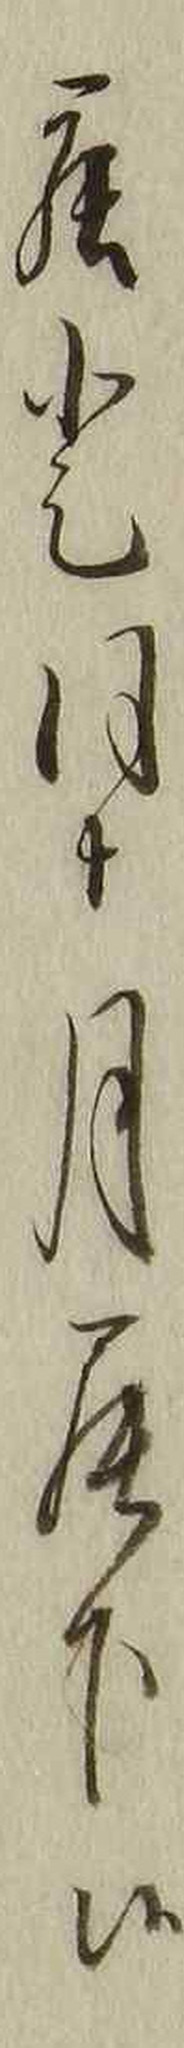罷登同十月罷下候
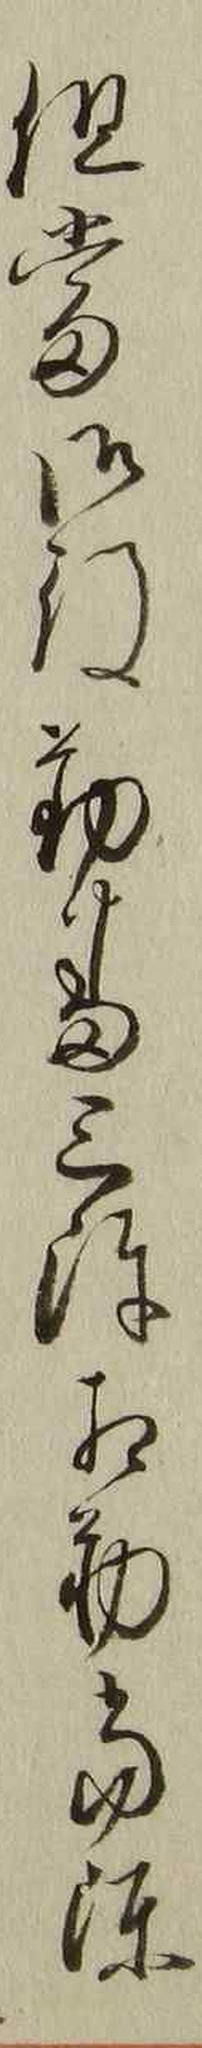但番御役勤番三陣相勤当陣
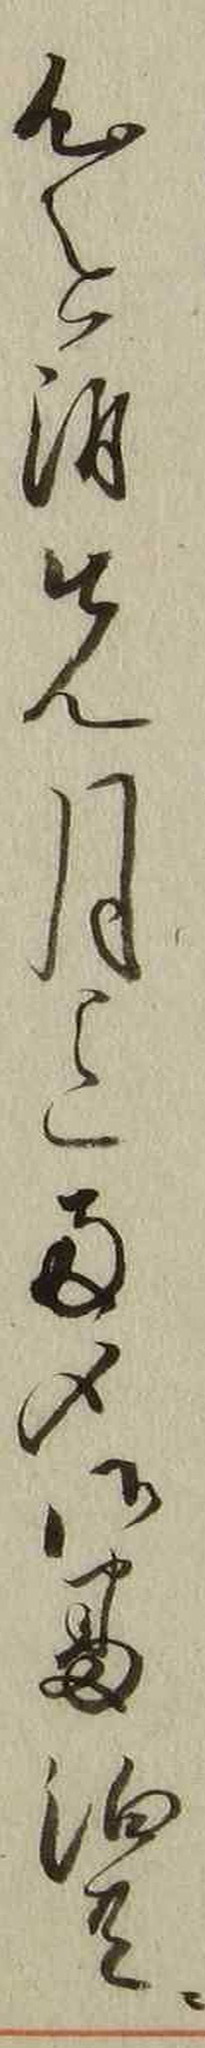心を附先月迄両〆御番泊共ニ
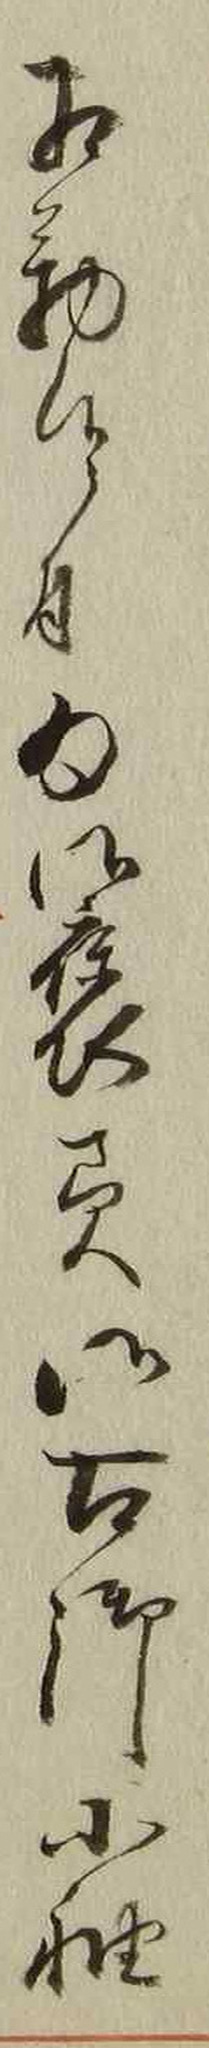相勤候ニ付為御褒美御古御小袖
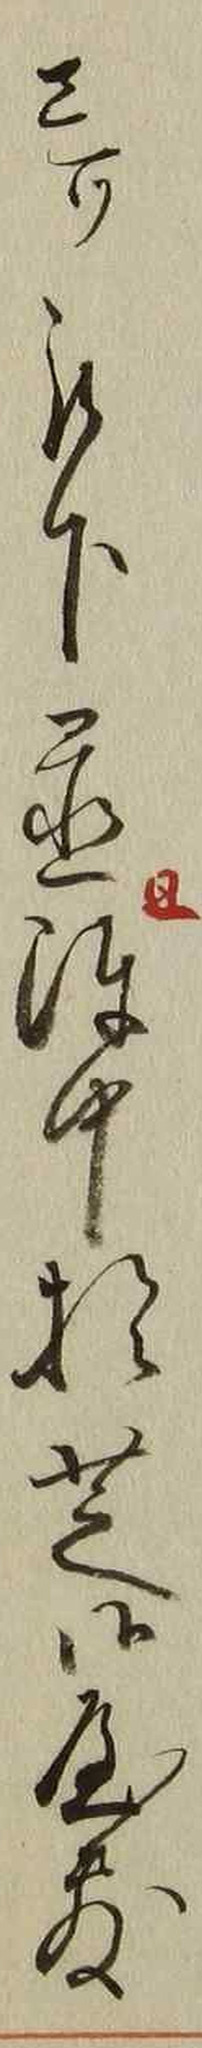壱ツ被下置且陣中於芝御屋敷
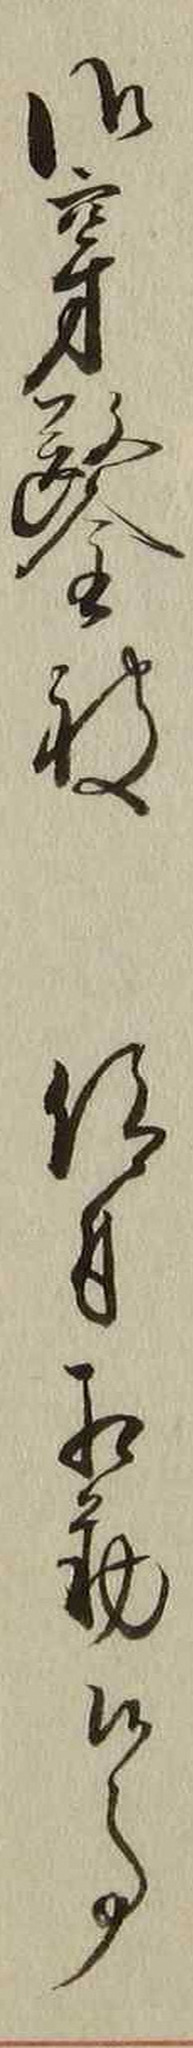御穿鑿被仰付相勤候事
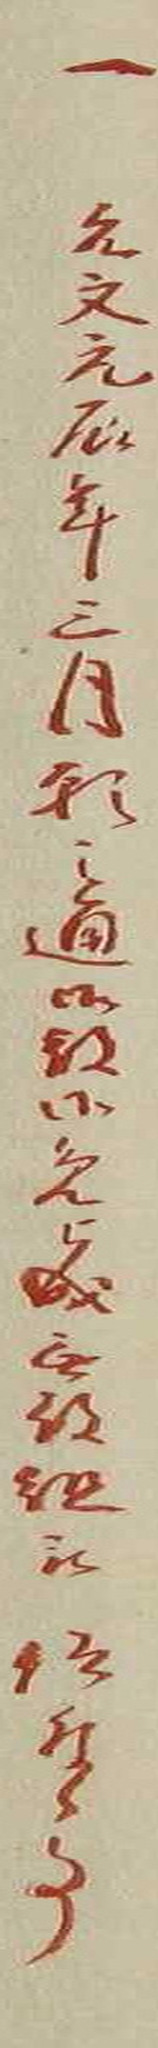一元文元辰年三月願之通御役御免被成無役組被仰付候事
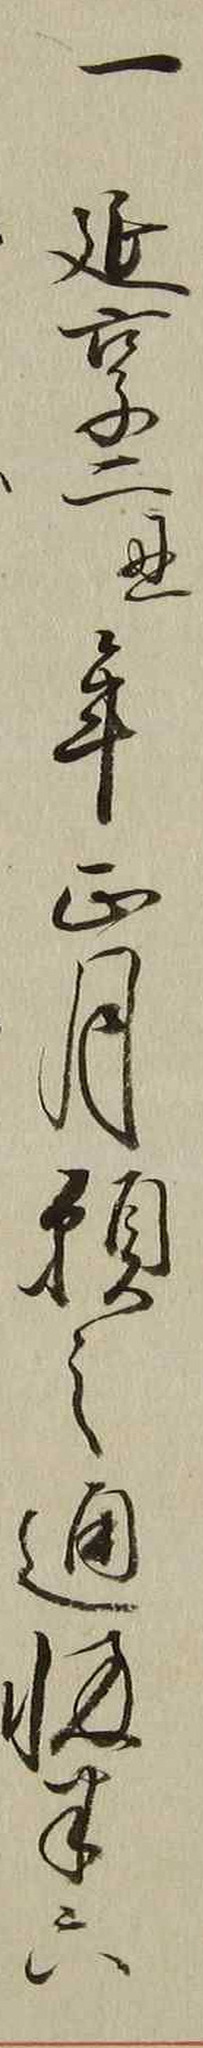一延享二丑年正月願之通忰半六
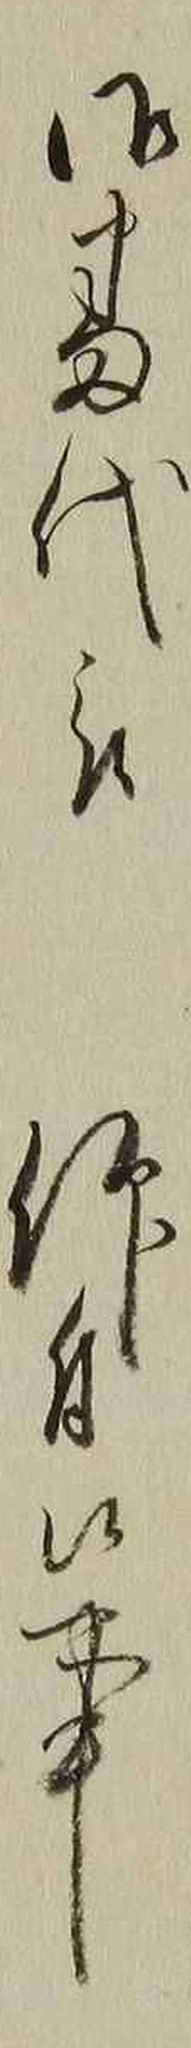御番代被仰付候事
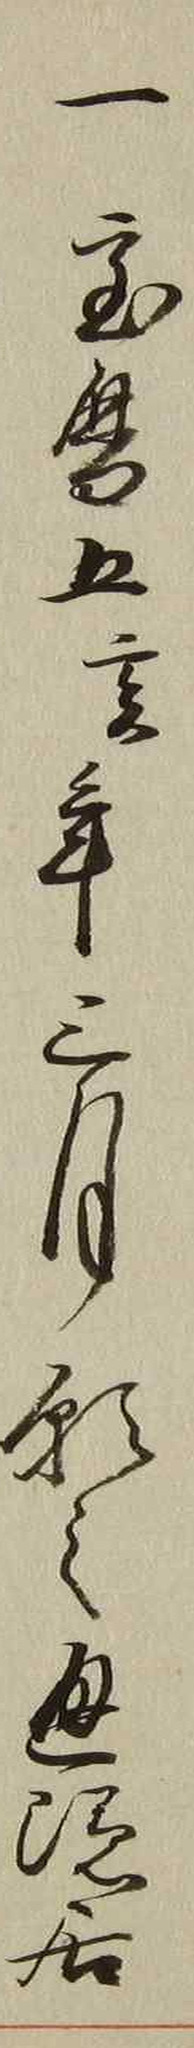一宝暦五亥年三月願之通隠居
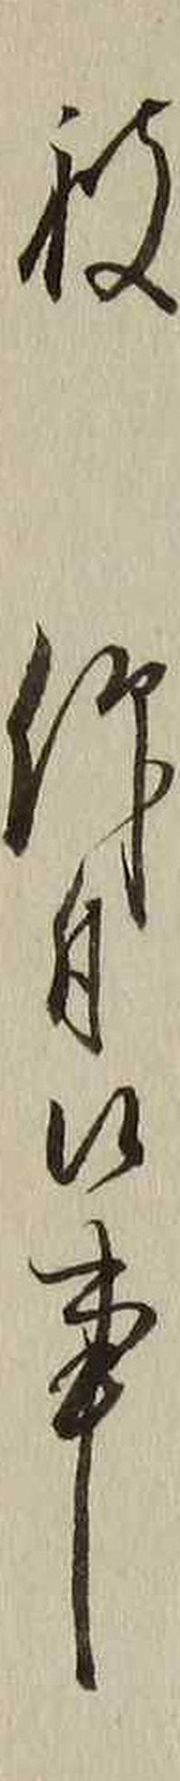被仰付候事
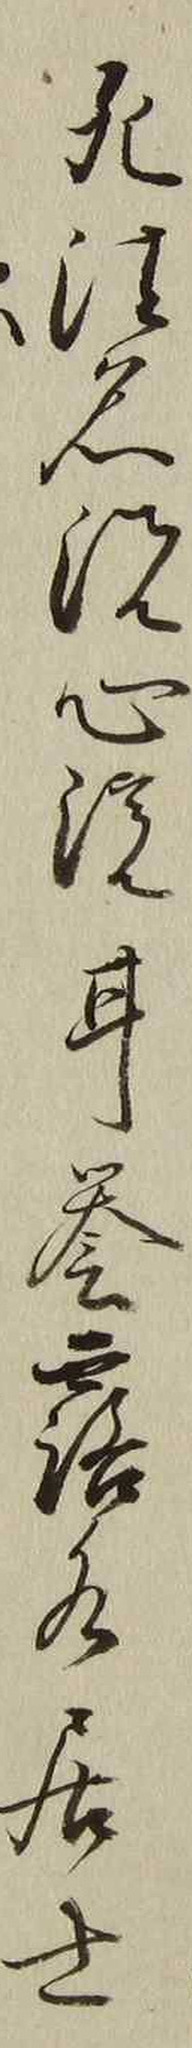死法名況？心院耳誉露水居士
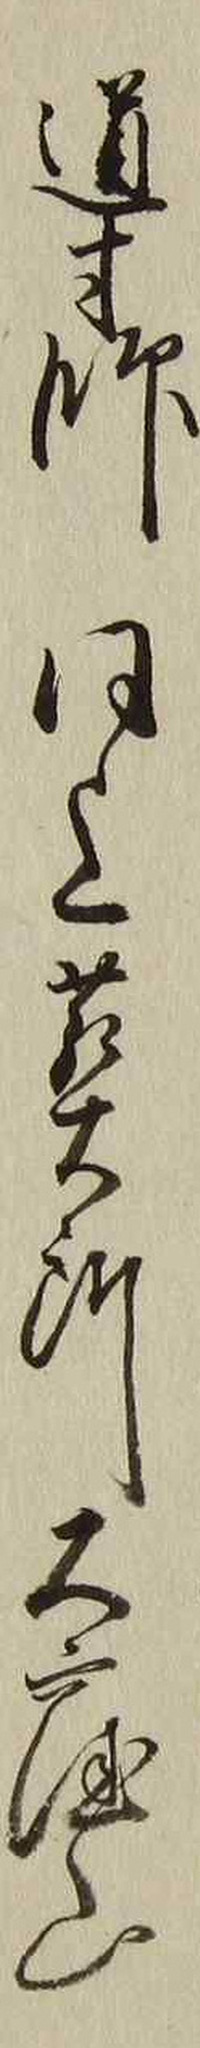導師同上葬所大窪山
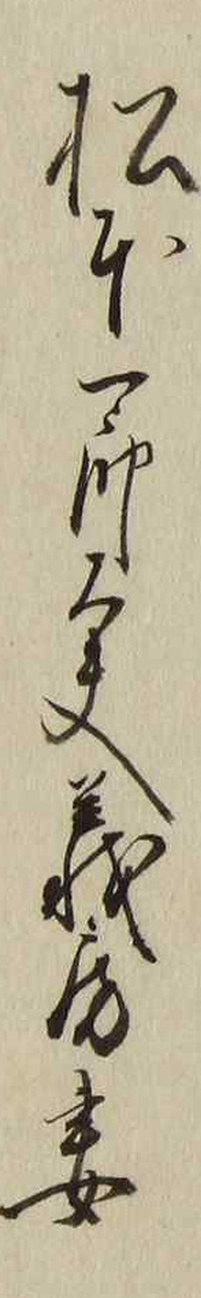松本一郎大夫義房妻

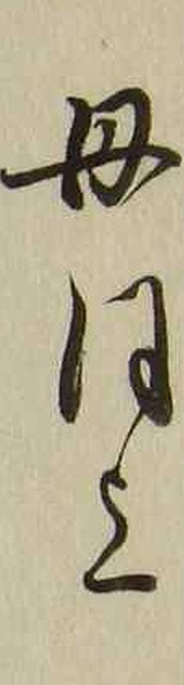母同上
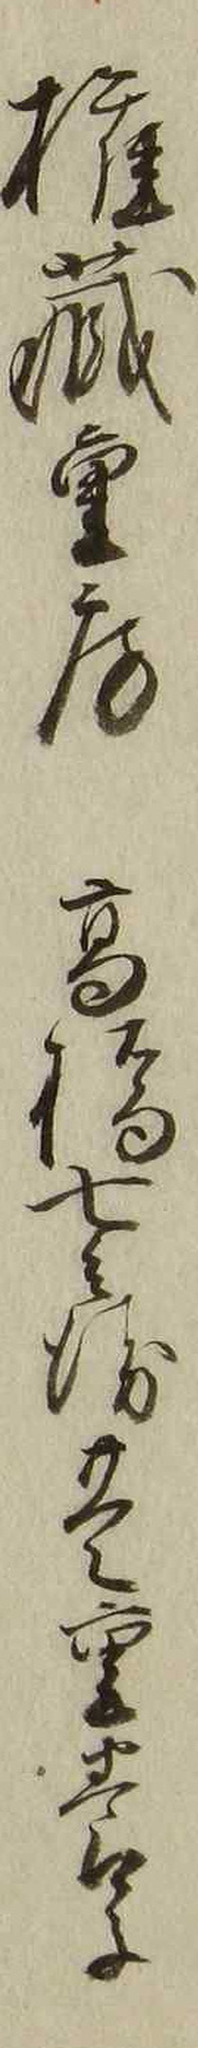権蔵重高橋七兵衛豊重養子
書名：諸士系譜　巻之2　い之部2
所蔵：会津若松市立会津図書館
